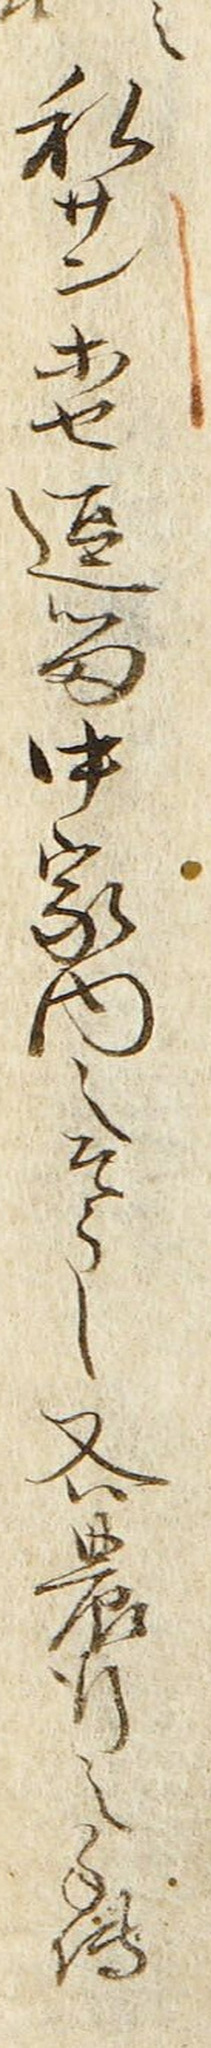私サンㇹセ逗留中家内之そらし又は農業の手伝
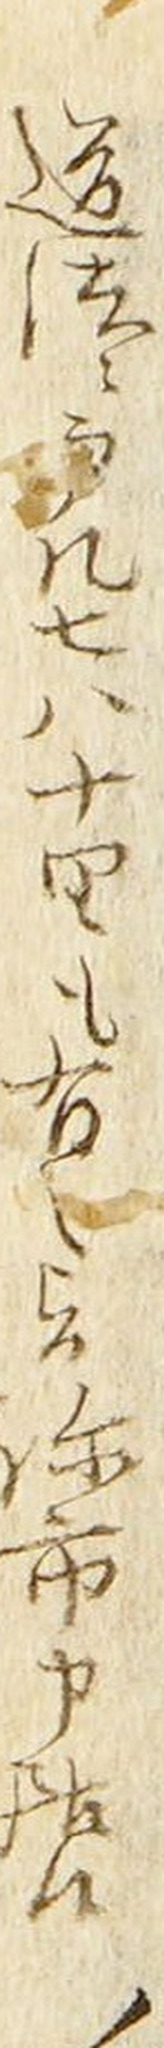道法に而凡七八十里も有之旨弥市申居候
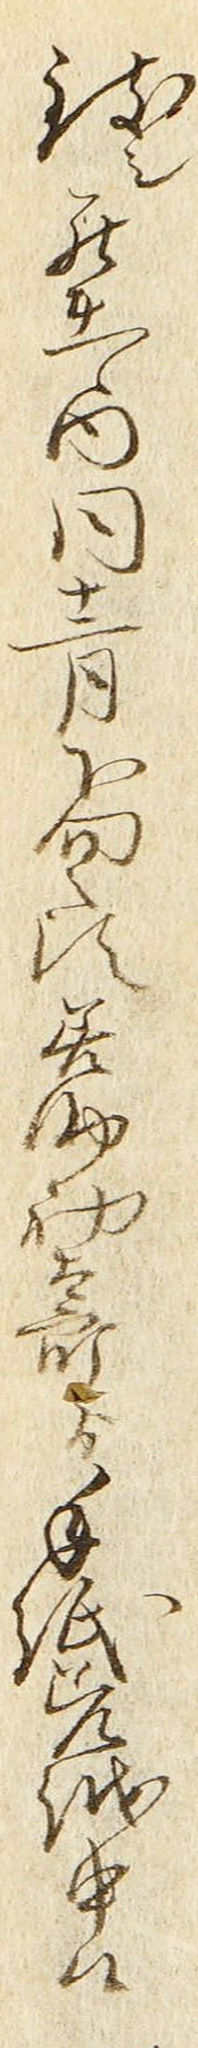致し罷在候内十二月下旬之頃善助初太郎ゟ手紙差越申候
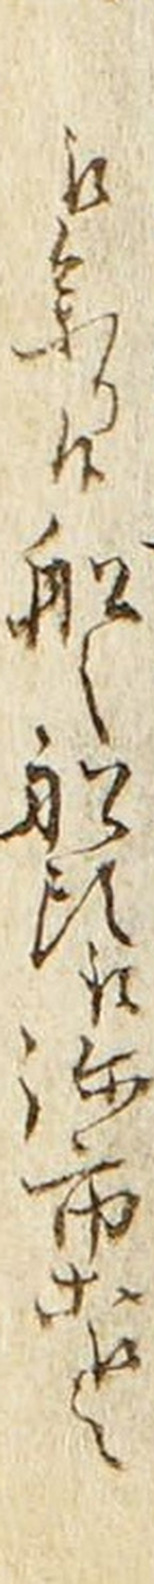江参り候船之船頭江弥市等江之
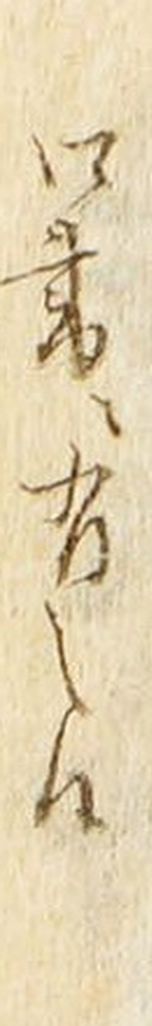口書に有之候
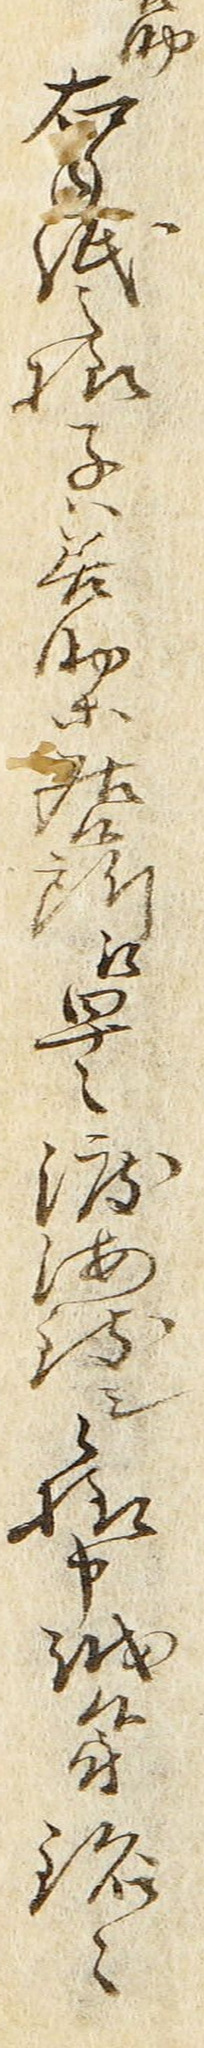右手紙之様子は善助等居候処江早々渡海致し候様申越候に付銘銘
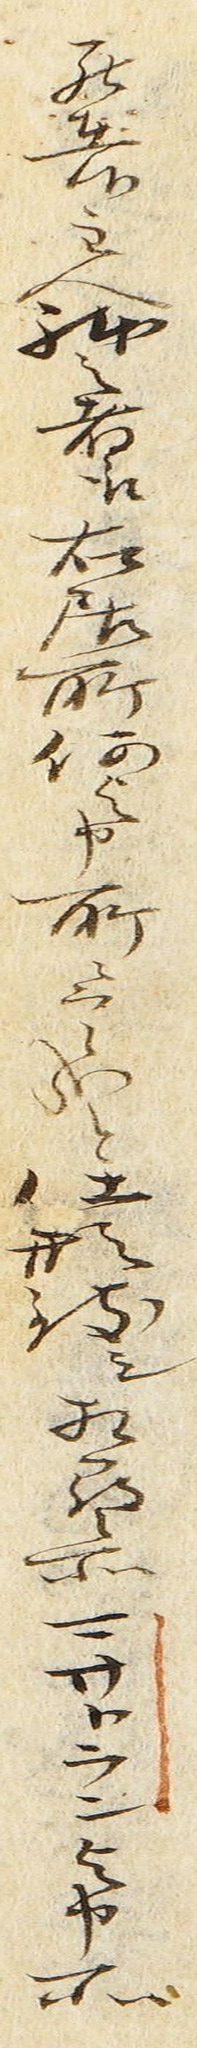罷在候主人躰之者江居所何と申所に而候哉と仕形致し相尋候所マサトランと申所
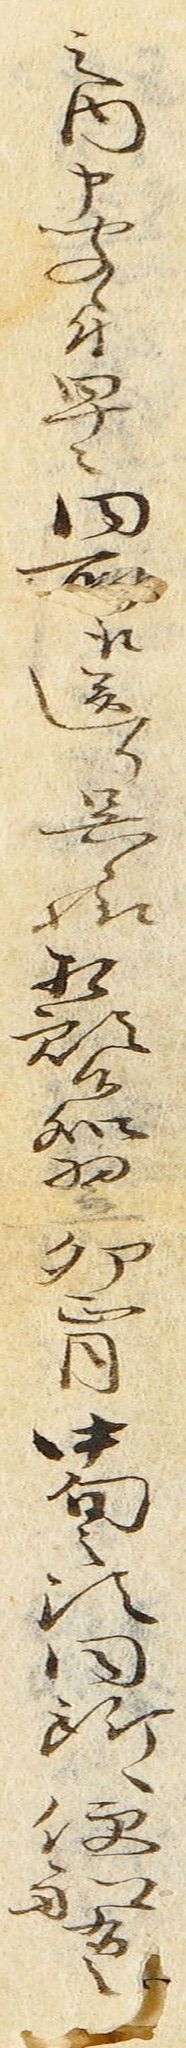之内申聞候付早々同所江送り呉候様相願候処翌卯正月中旬之頃同所へ便船有之
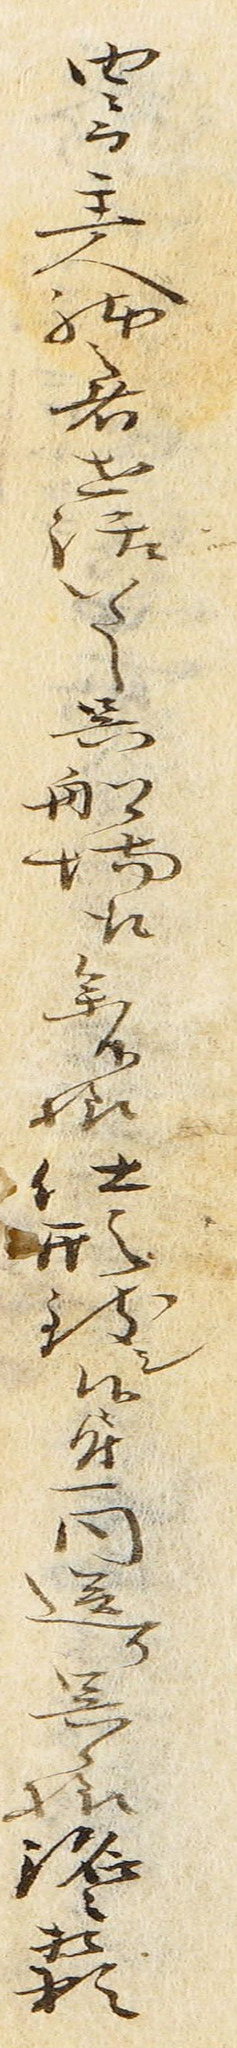由に而主人躰之者世話いたし異船場江参り候様仕形致し候に付一同送り呉様銘銘相願
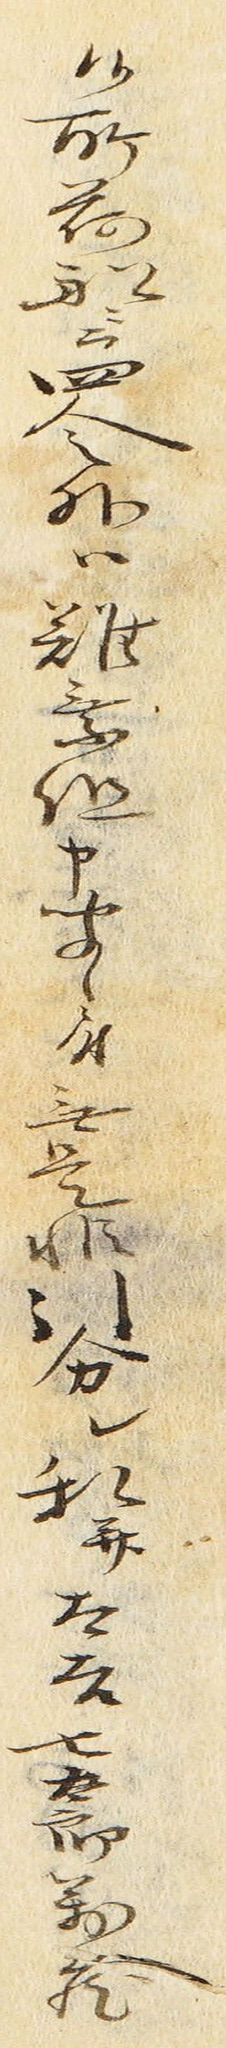候所荷船に而四人之外は難乗組申聞候に付無是非引分れ私並太吉七太郎善蔵
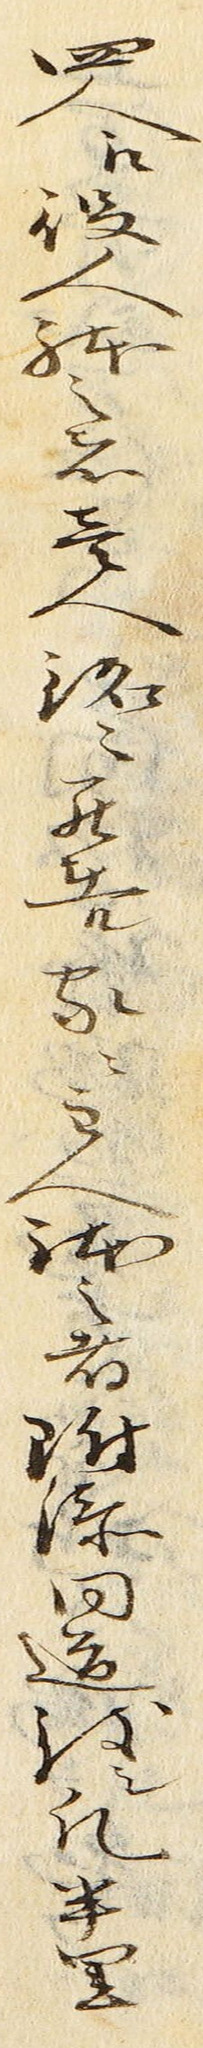四人江役人躰之者壱人銘銘罷在る家に主人躰之者附添同道致し凡半里
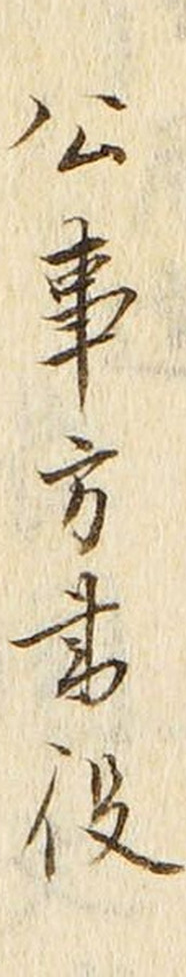公事方書役
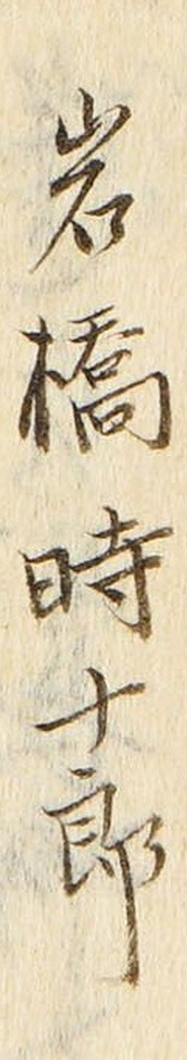岩橋時十郎
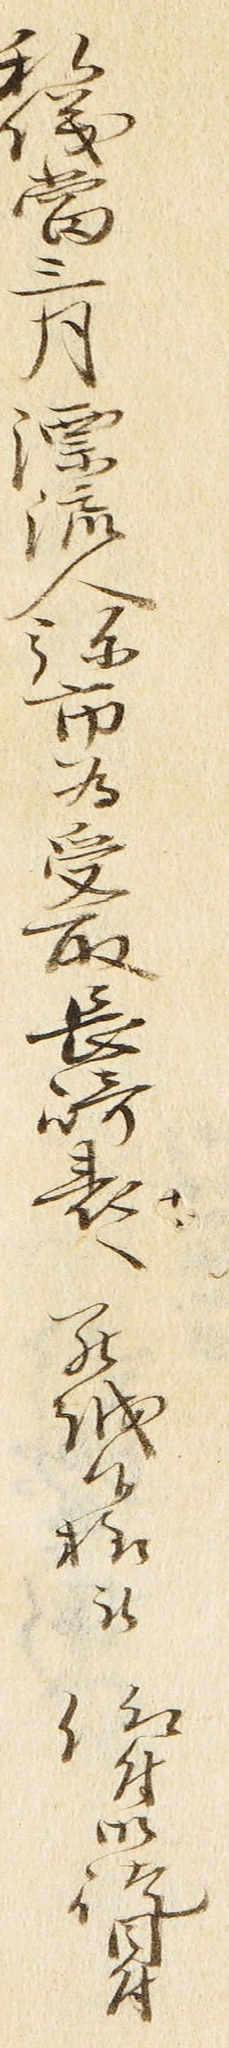私儀当三月漂流人弥市為受取長崎表へ罷越候様被仰付御徒目付
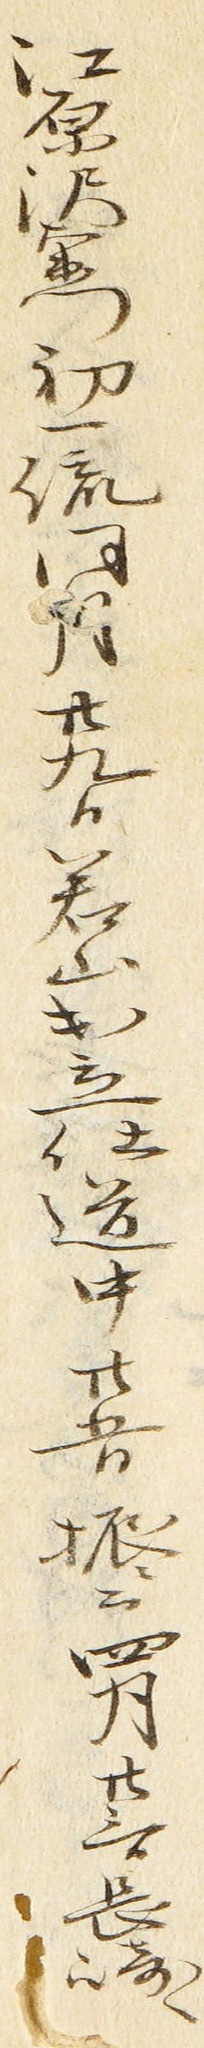江原沢左衛門初一統同月廿九日若山出立仕道中廿五日振に而四月廿三日長崎へ
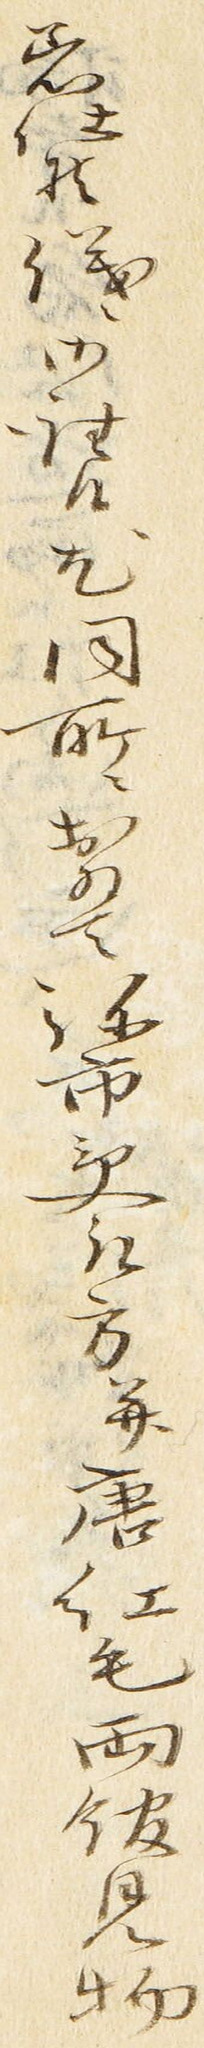着仕候儀に御座候尤同所におゐて弥市受取方並唐紅毛両彼見物
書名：長崎漂流記
